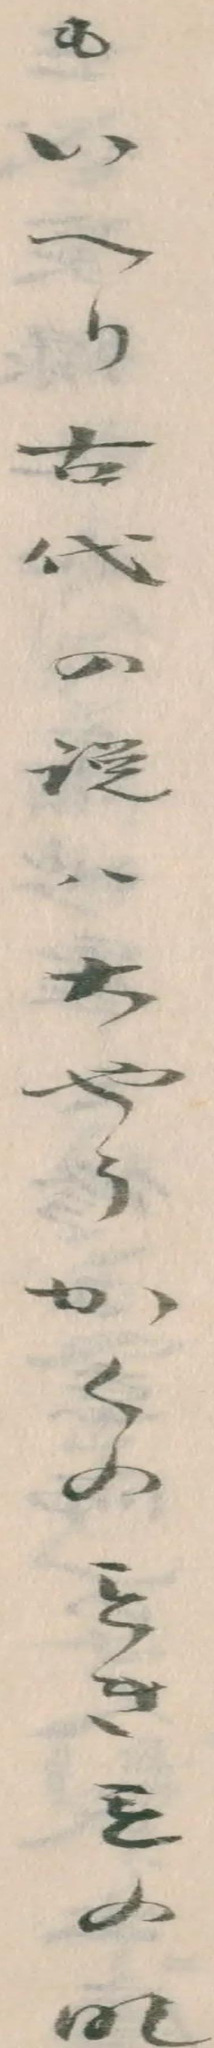もいへり古代の説は大やうかくのこときものな
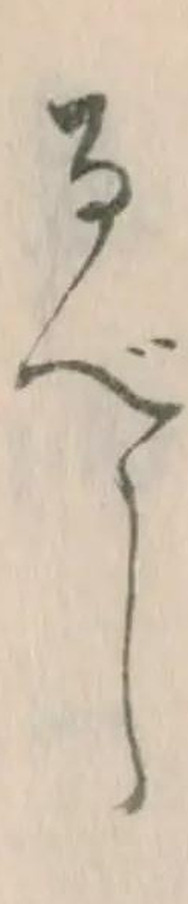るべし
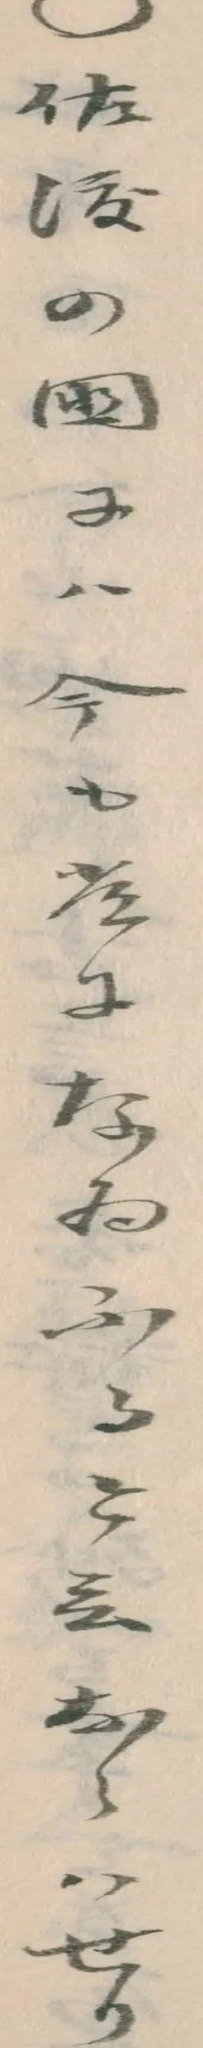○佐渡の国には今も常になゐふると言ならはせり

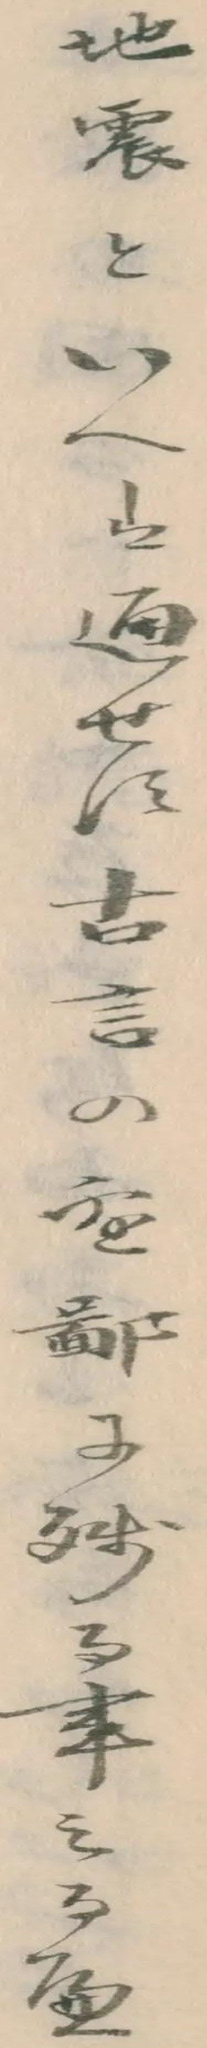地震といへは通せす古言の辺鄙に残る事みるへ
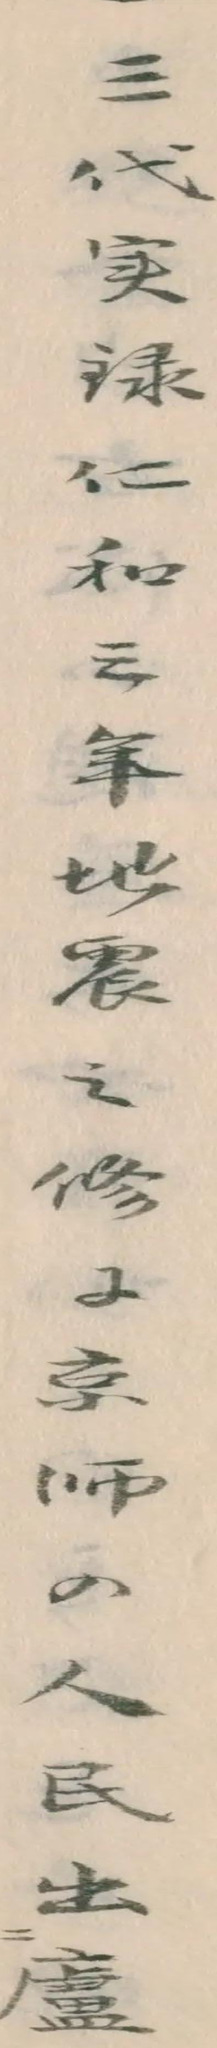○三代実録仁和三年地震之条に京師の人民出廬
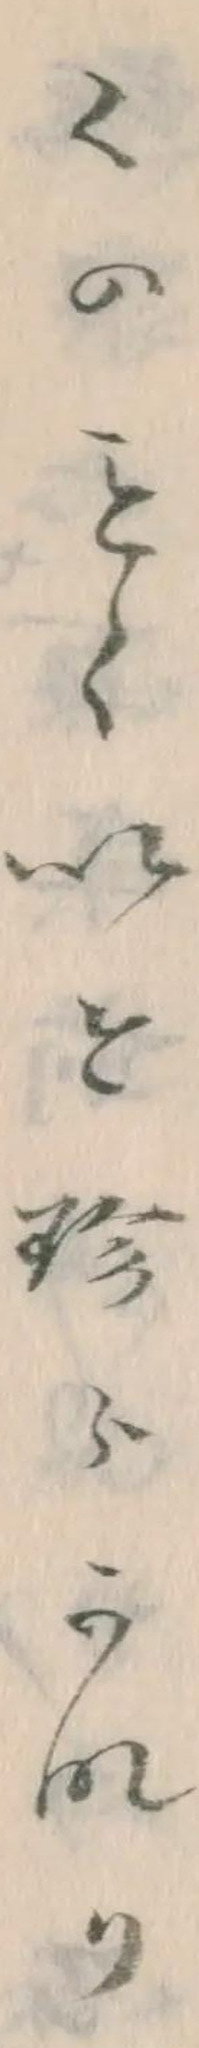くのことくいと珍らかなり
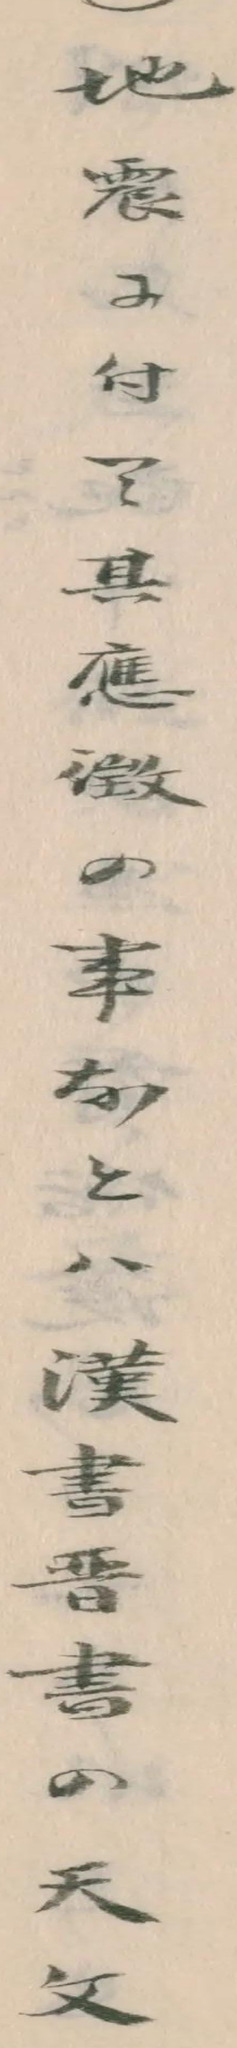○地震に付て其応徴の事なとは漢書晋書の天文
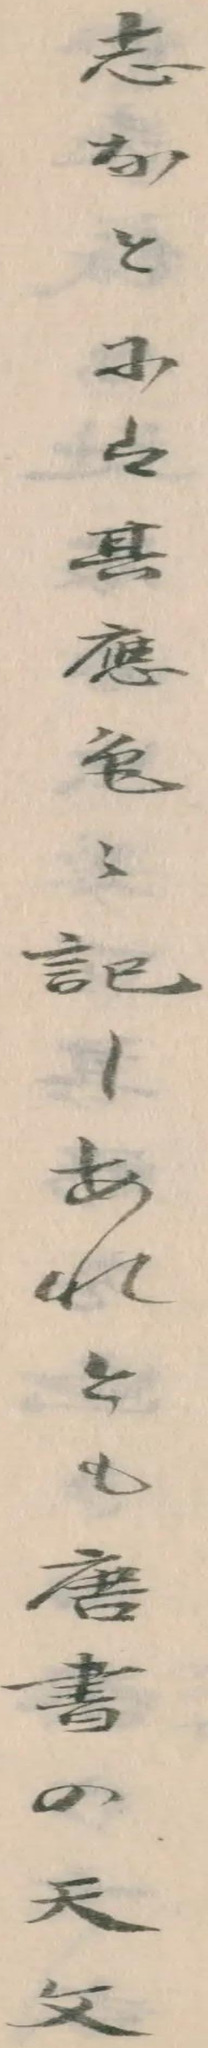志なとには其応色々記しあれとも唐書の天文
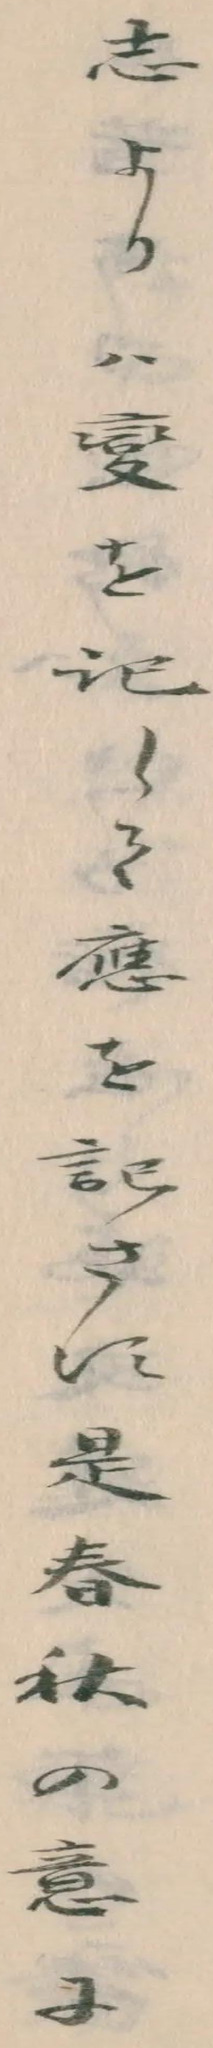志よりは変を記して応を記さす是春秋の意に
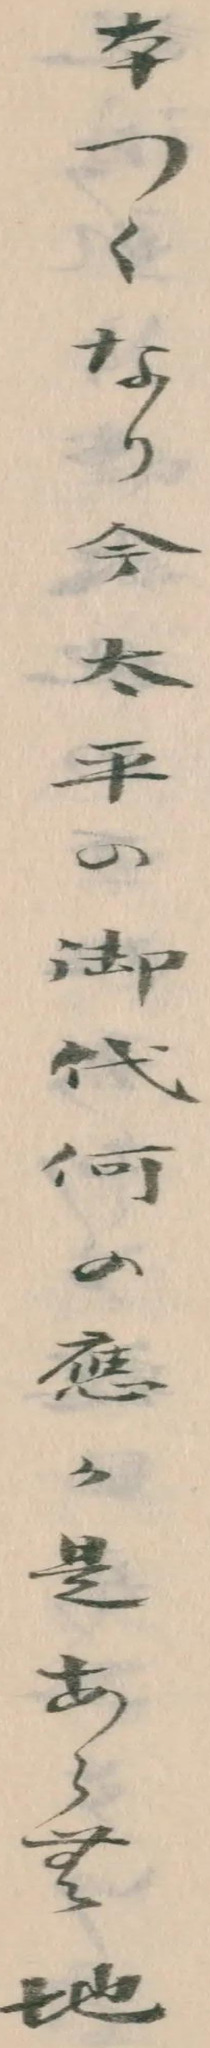本つくなり今太平の御代何の応か是あらむ地
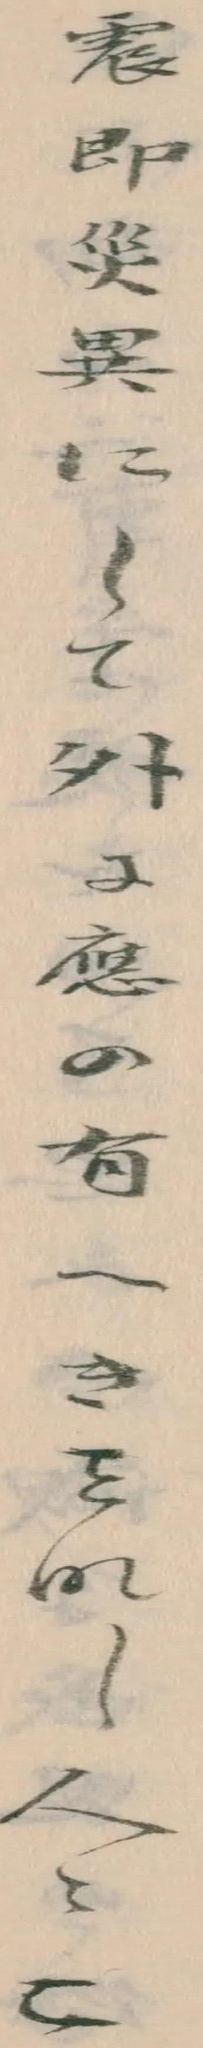震即災異にして外に応の有へきことなし人々こ
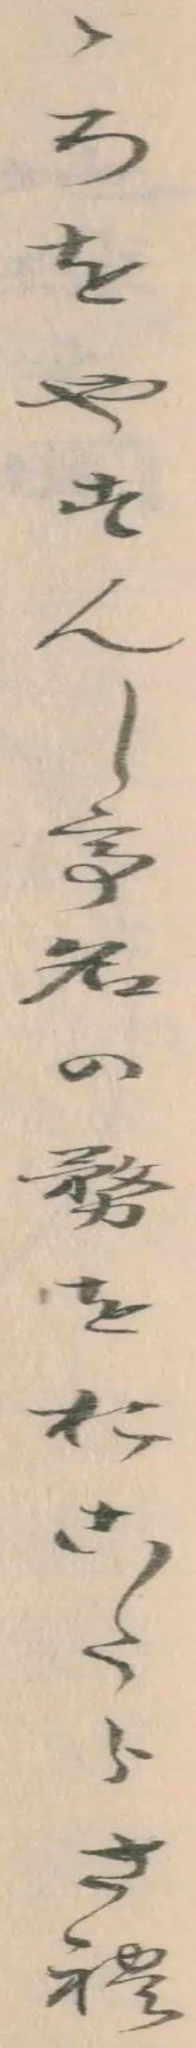ゝろをやすんして各の務をおこたらされ
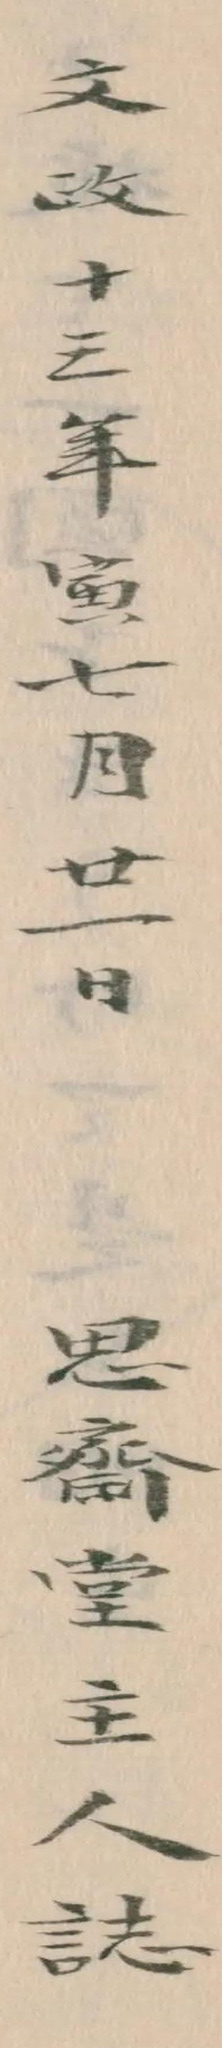文政十三年寅七月廿一日思斉堂主人誌
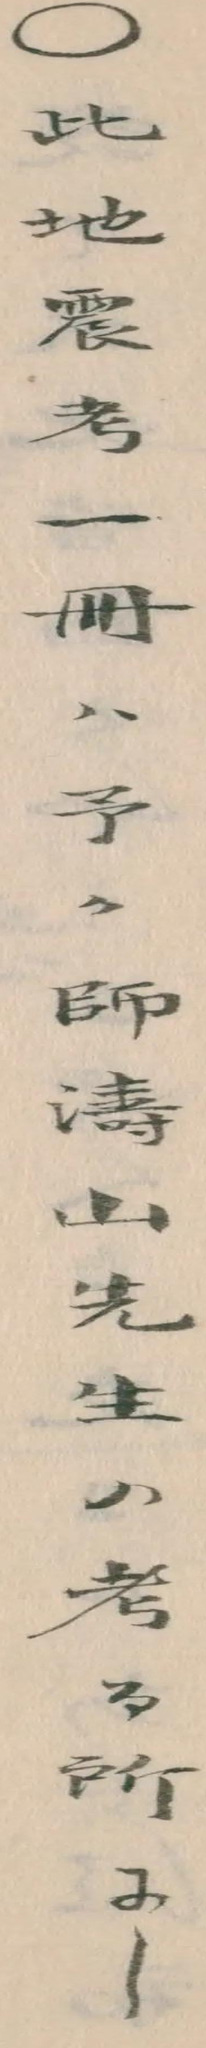○此地震考一冊は予か師涛山先生の考る所にし
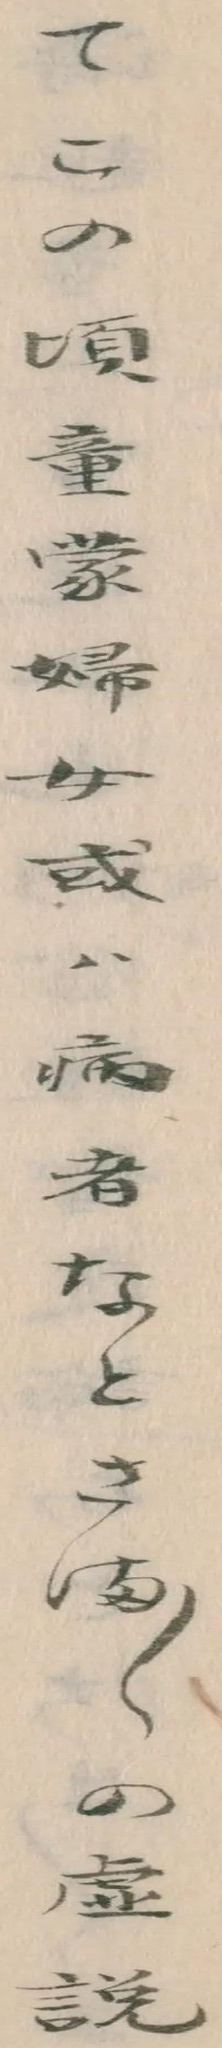てこの頃童蒙婦女或は病者なとさま〳〵の虚説
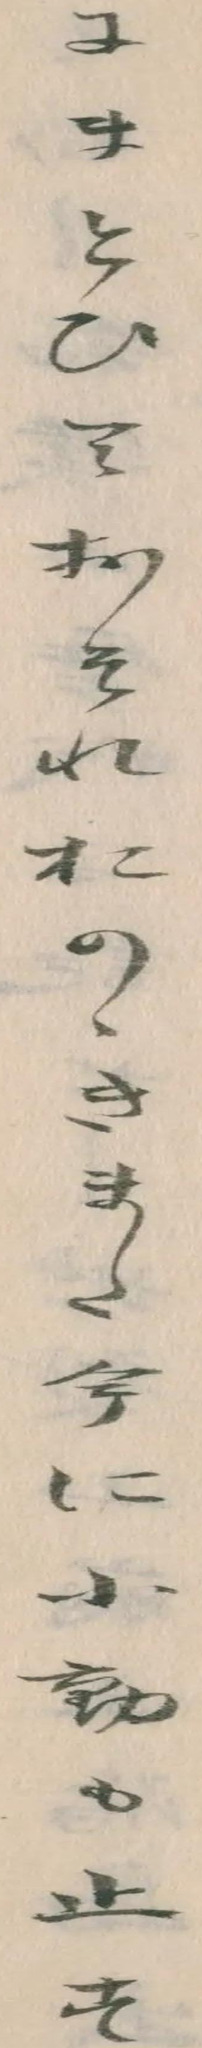にまとひておそれおのゝきまた今に小動も止す
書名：地災撮要. 巻11-12(地震之部)
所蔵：国立国会図書館 National Diet Library, JAPAN
